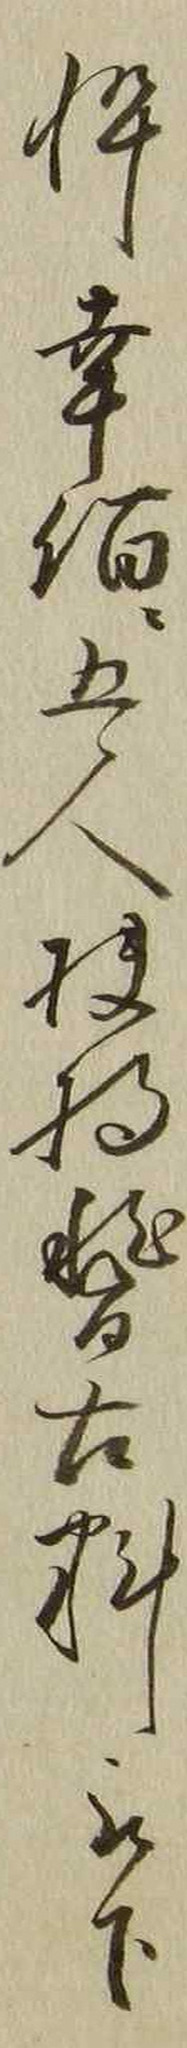忰幸伯ニ五人扶持稽古料被下
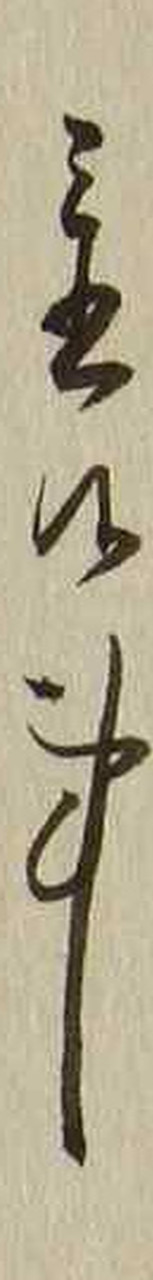置候事
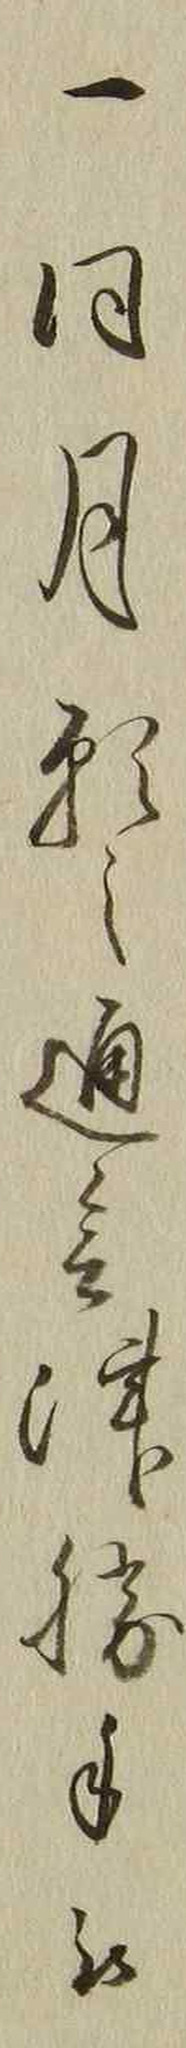一同月願之通会津勝手被
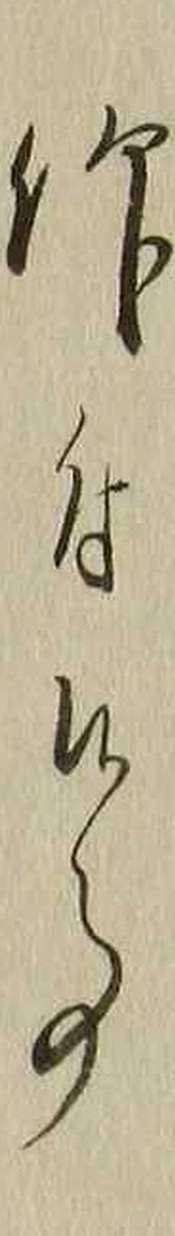仰付候事
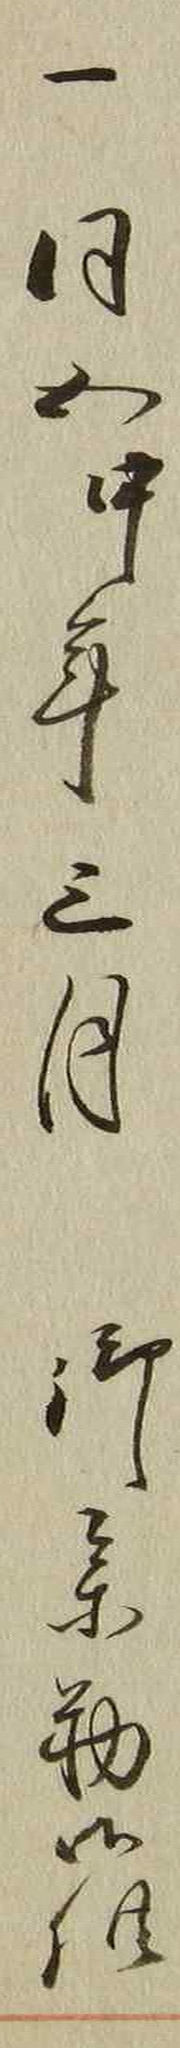一同五申年三月御参勤御供
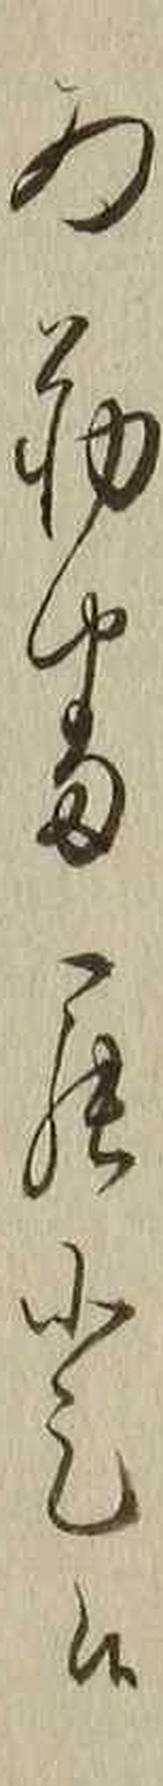為勤番罷登候
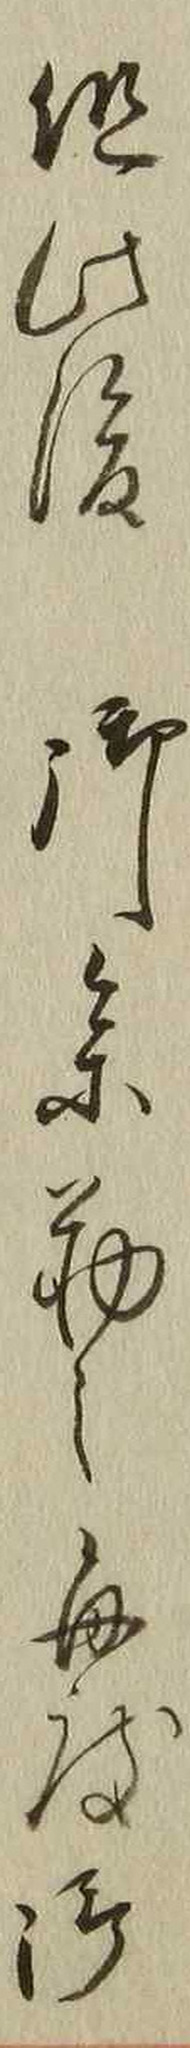但此後御参勤之毎度御
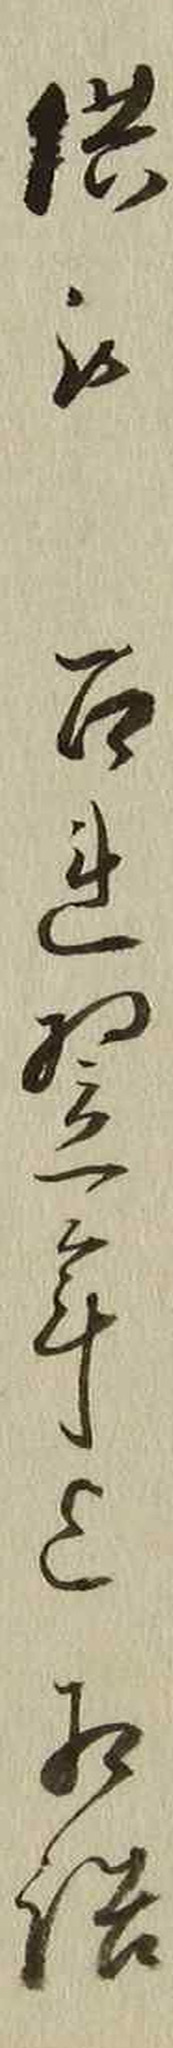供被召連翌年迄相詰
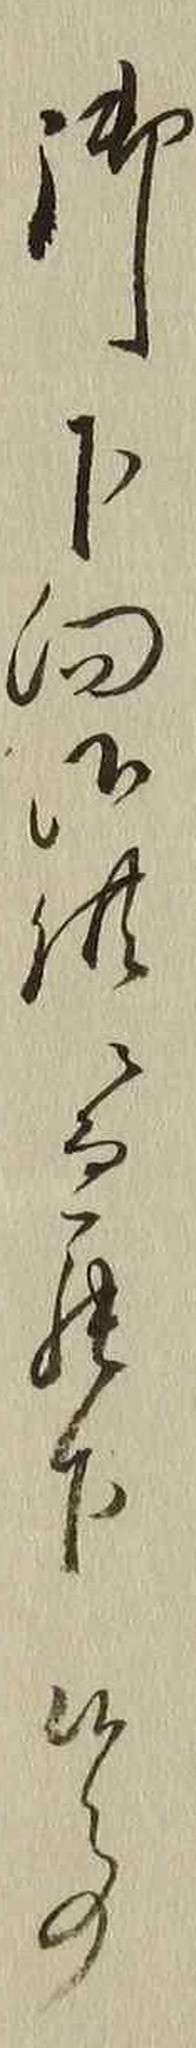御下向御供ニ而罷下候事
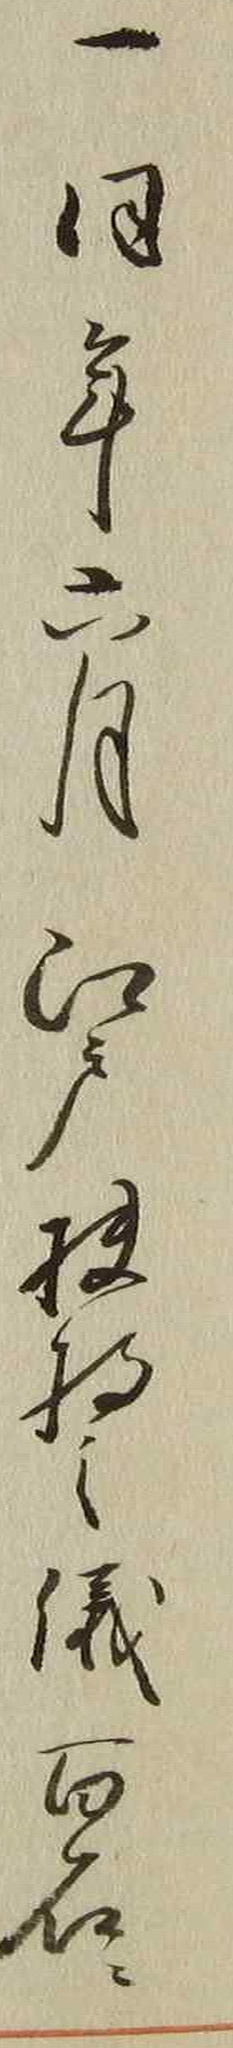一同年六月江戸扶持之儀百石ニ
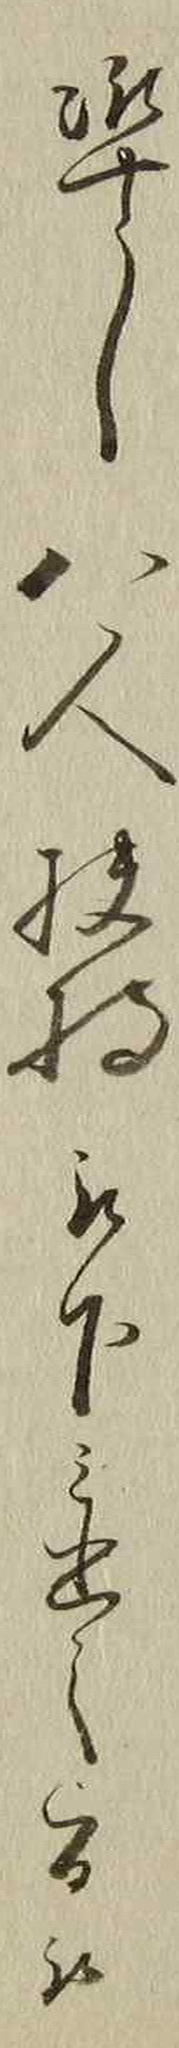準し八人扶持被下置之旨被
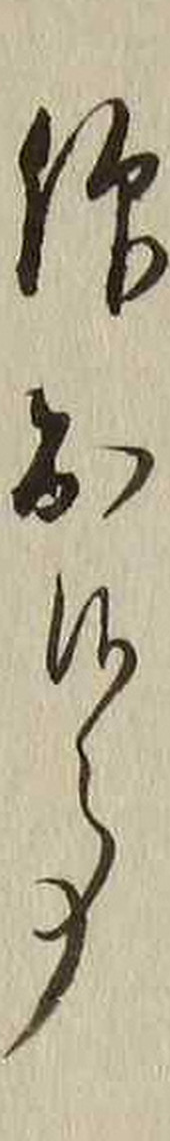仰出候事
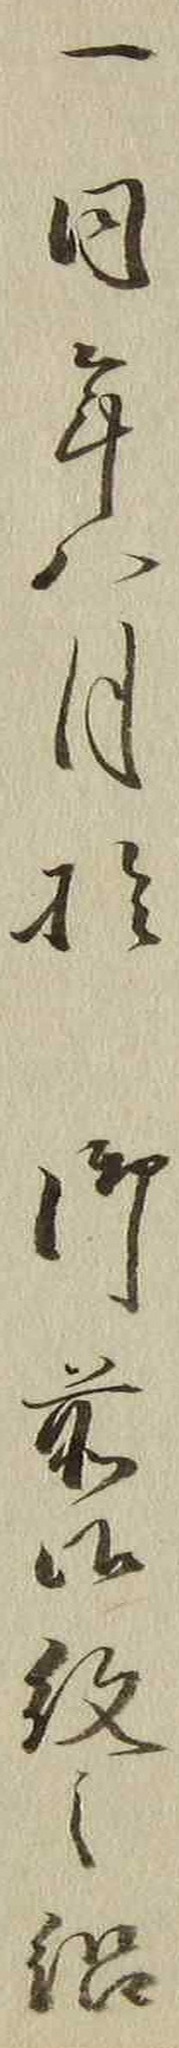一同年八月於御前御紋之絽
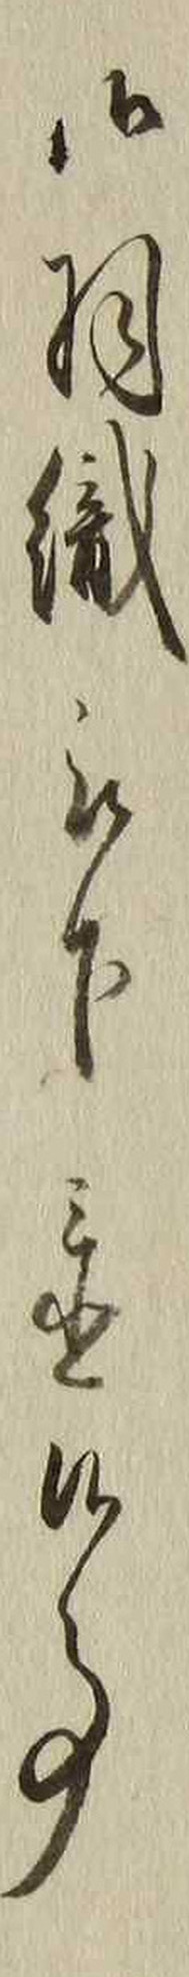御羽織被下置候事
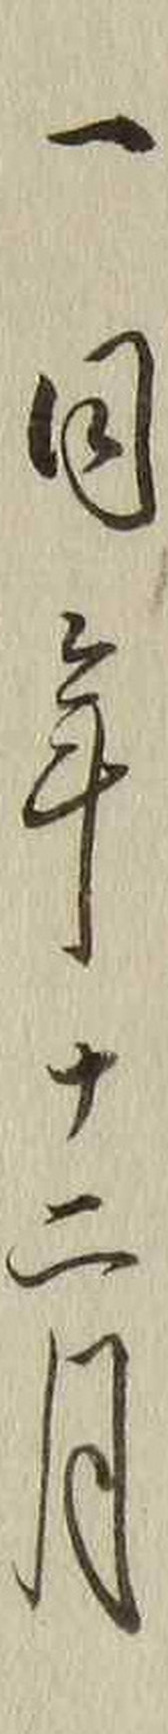一同年十二月
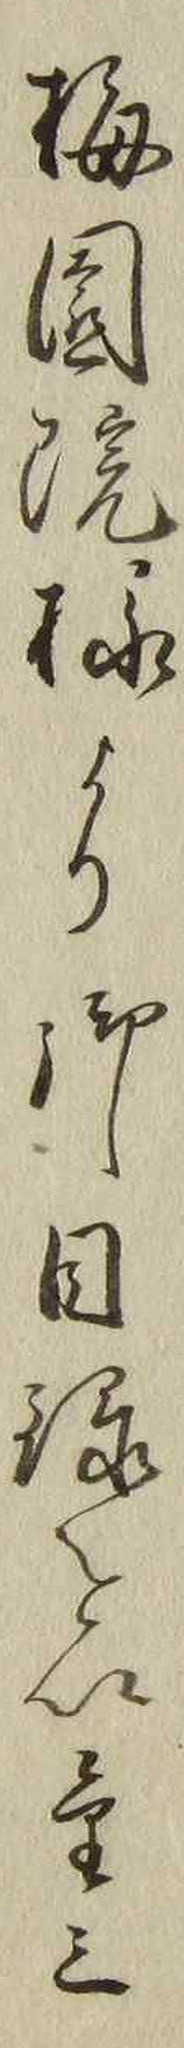梅園院様より御目録を以金三
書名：諸士系譜　巻之68　を之部2
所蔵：会津若松市立会津図書館
